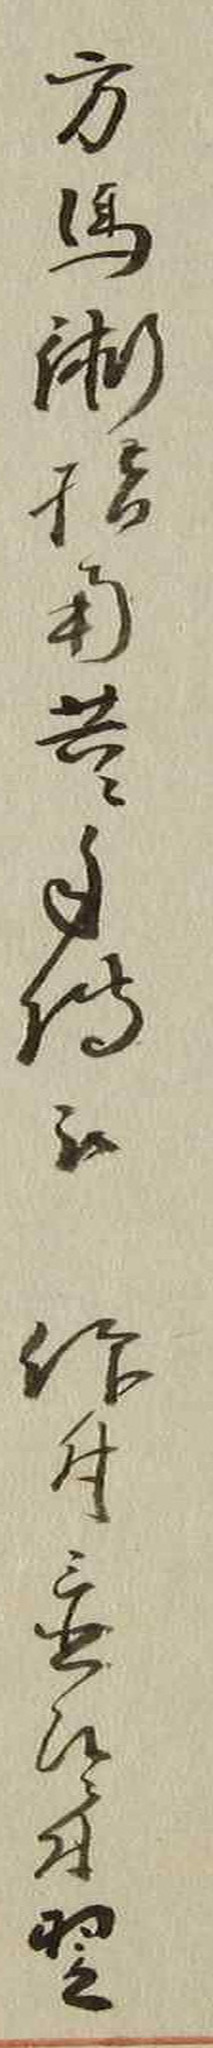方馬術指南共ニ手伝被仰付置候ニ付翌
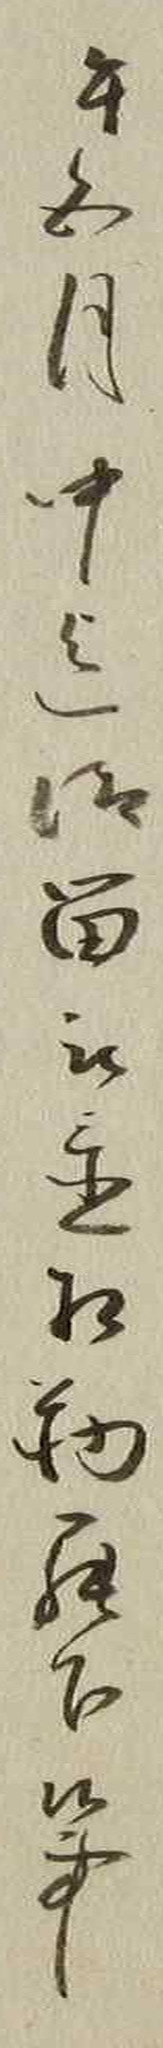午五月中迄御留被置相勤罷下候事
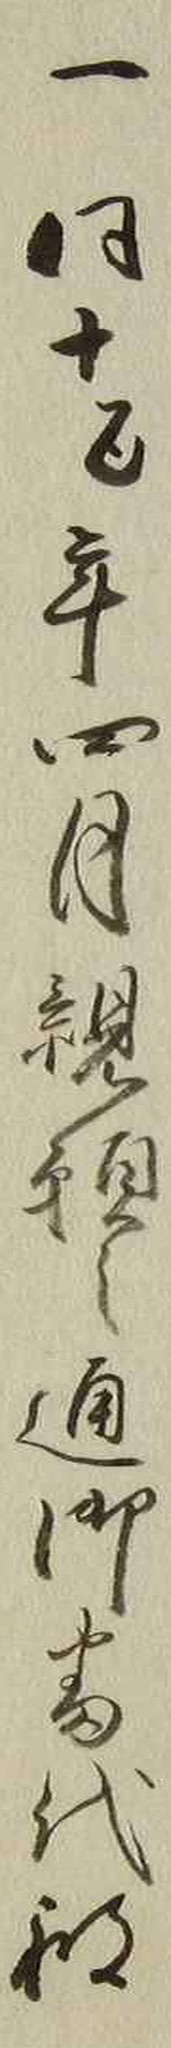一同十酉年四月親願之通御番代被
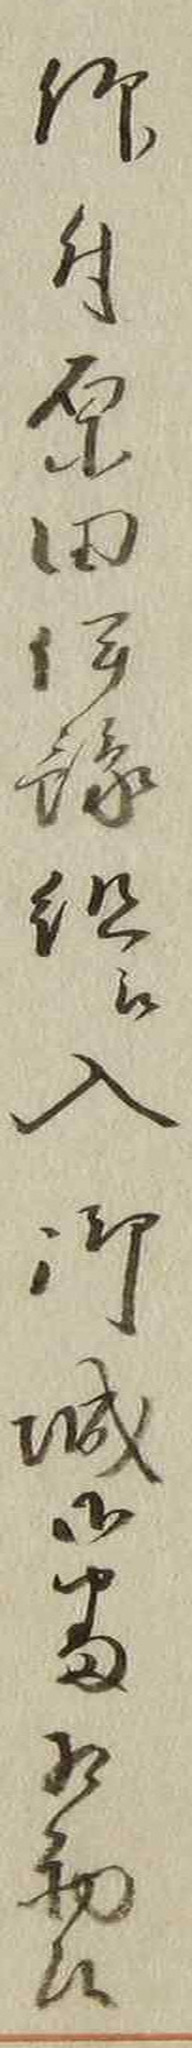仰付原田伊予組江入御城御番相勤候
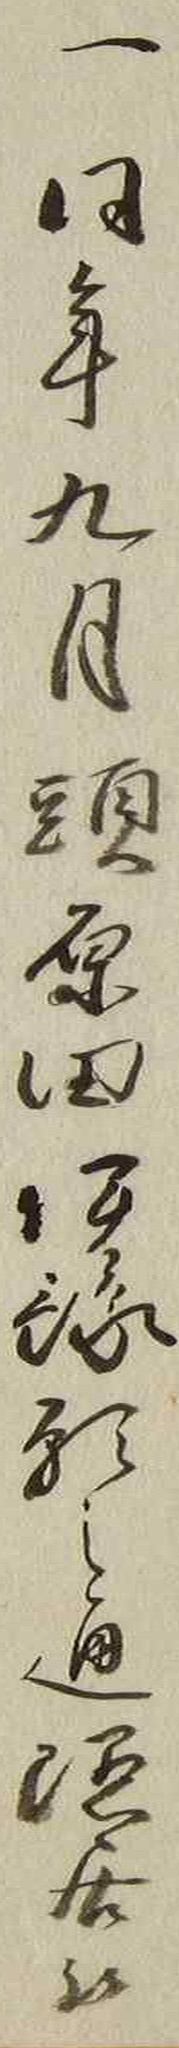一同年九月頭原田伊予願之通隠居被
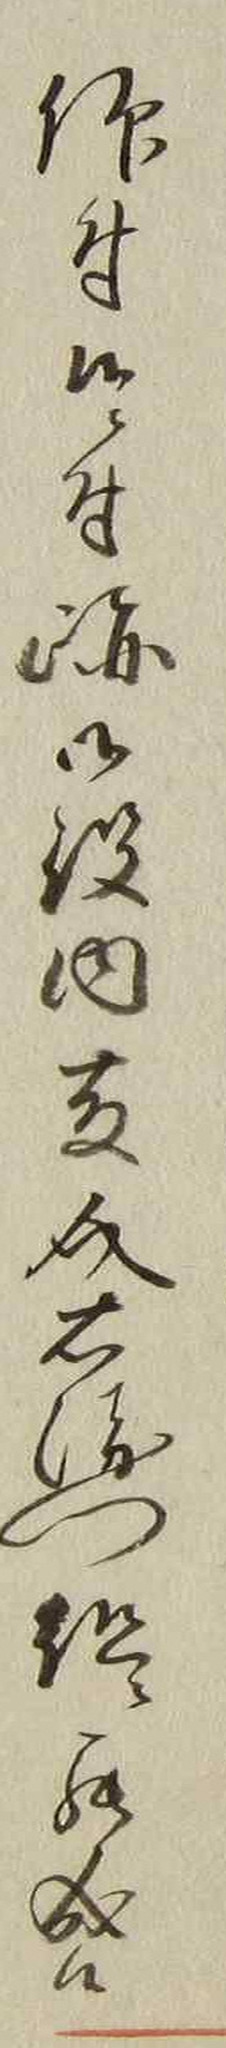仰付候ニ付跡御役内藤介右衛門組ニ罷成候
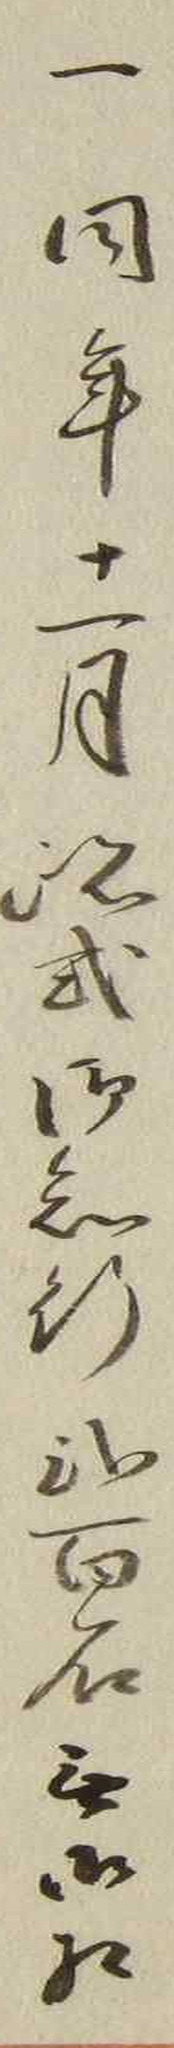一同年十一月跡式御知行弐百石無御相
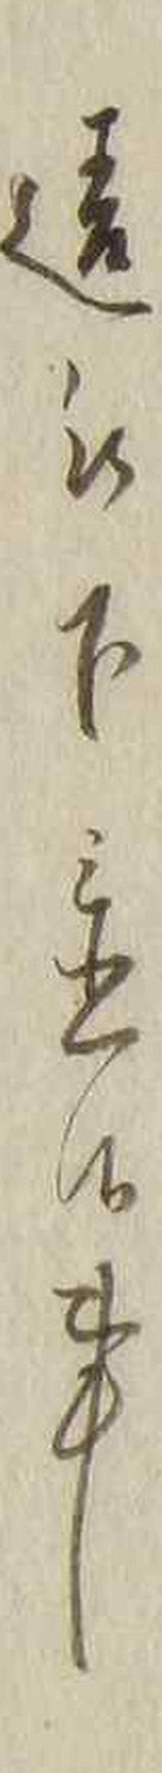違被下置候事

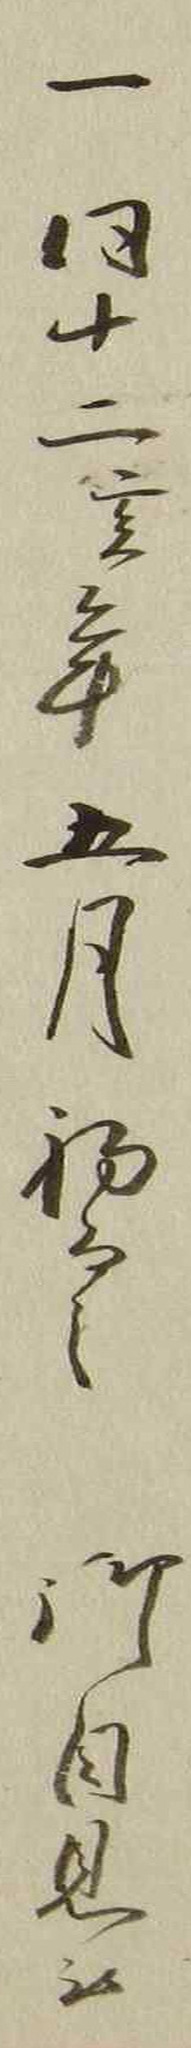一同十二亥年五月初而之御目見被
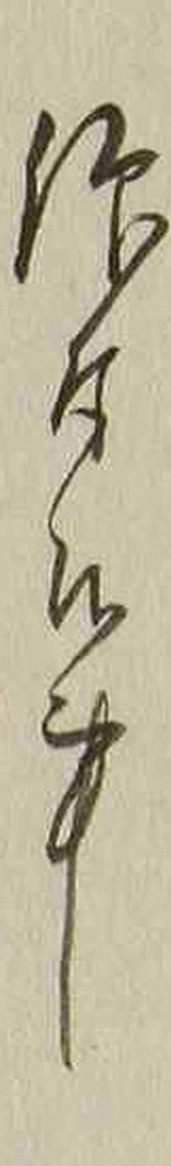仰付候事
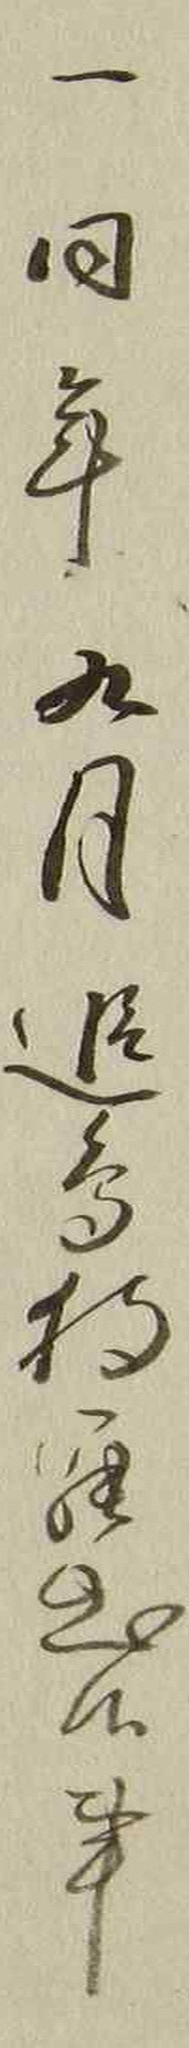一同年九月追鳥狩罷出候事
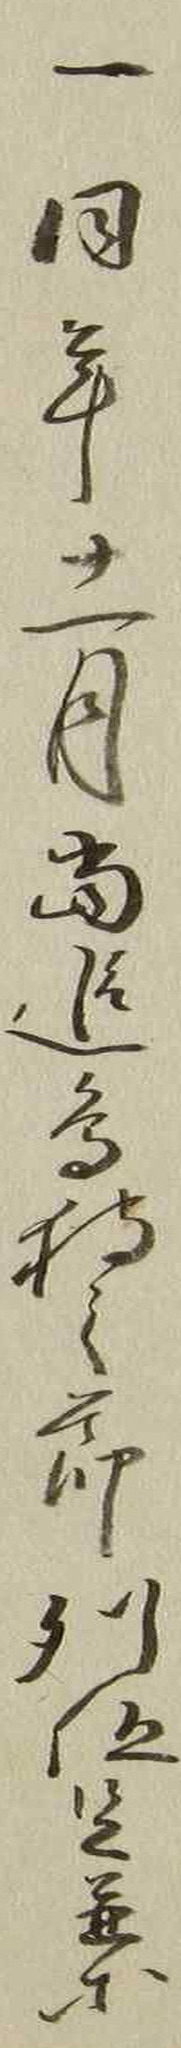一同年十一月当追鳥狩之節列伍足並等
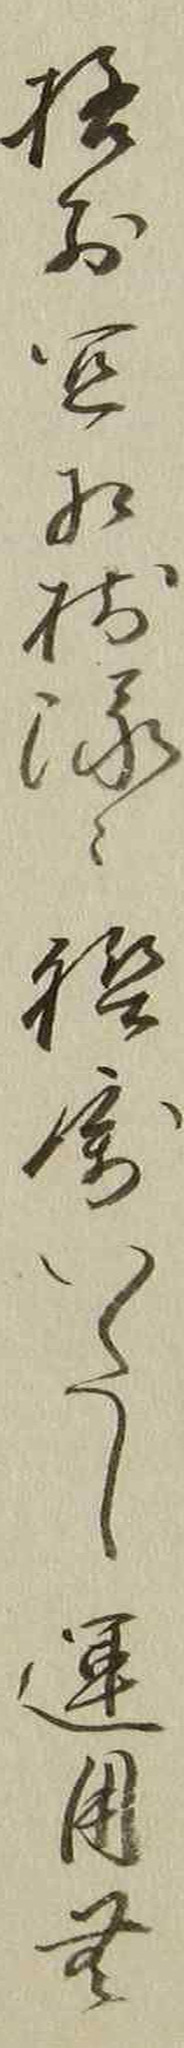格別宜相揃隊々聯属いたし運用無
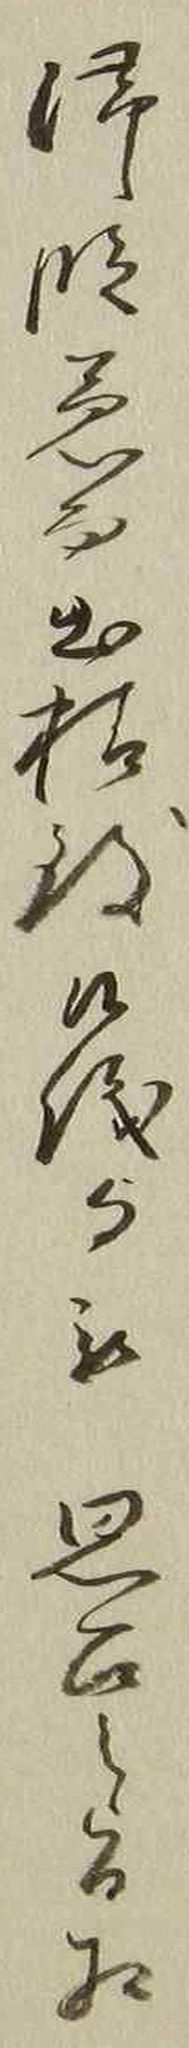滞段兼而出精致候儀与被思召之旨相
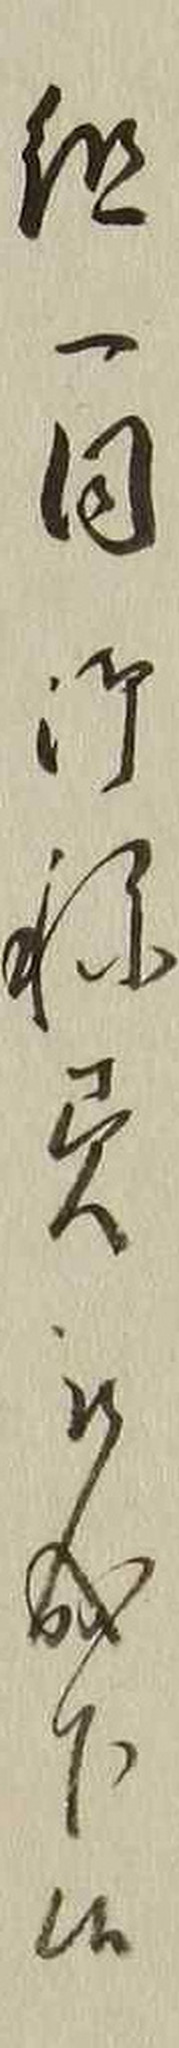組一同御称美被成下候
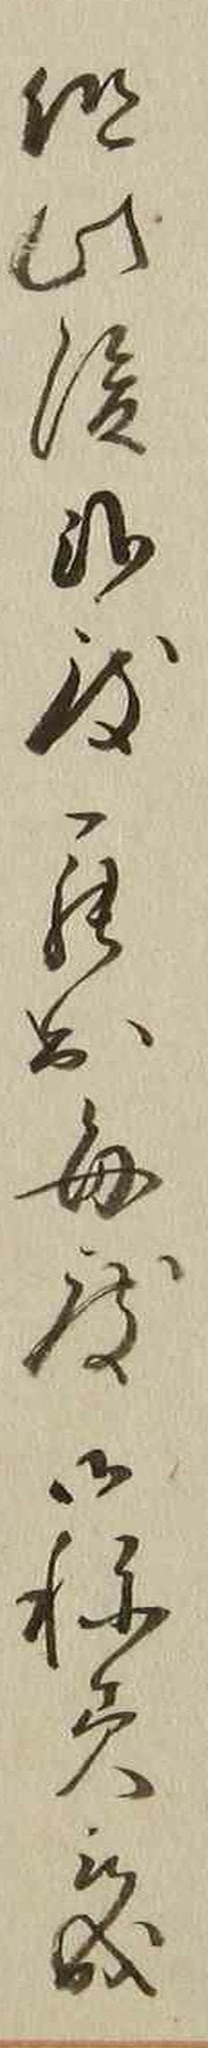但此後弐度罷出毎度御称美被成
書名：諸士系譜　巻之122　よ之部5
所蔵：会津若松市立会津図書館
